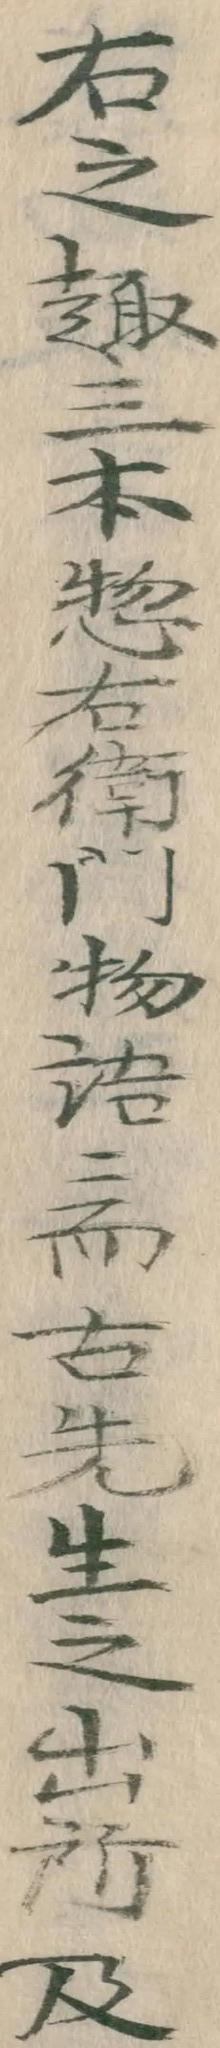右之趣三木惣右衞門物語ニテ古先生之出所及
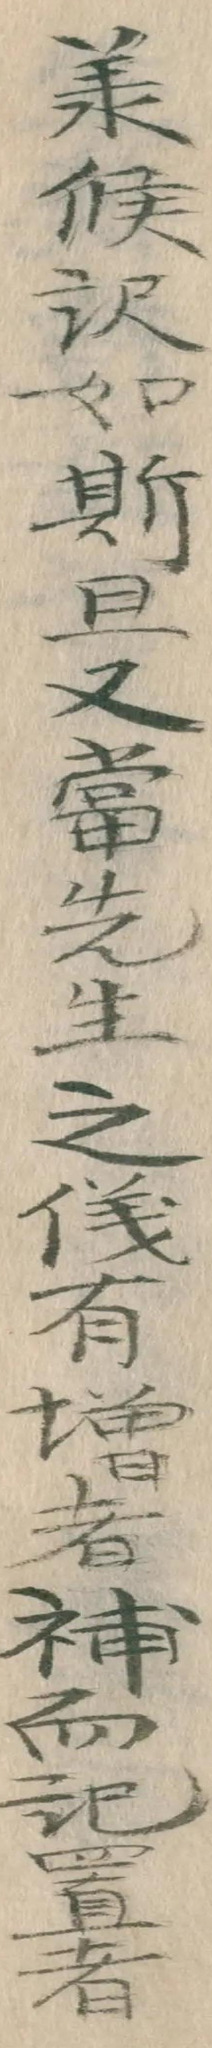𣴎候訳如期旦又当先生之儀有増者補テ記置者
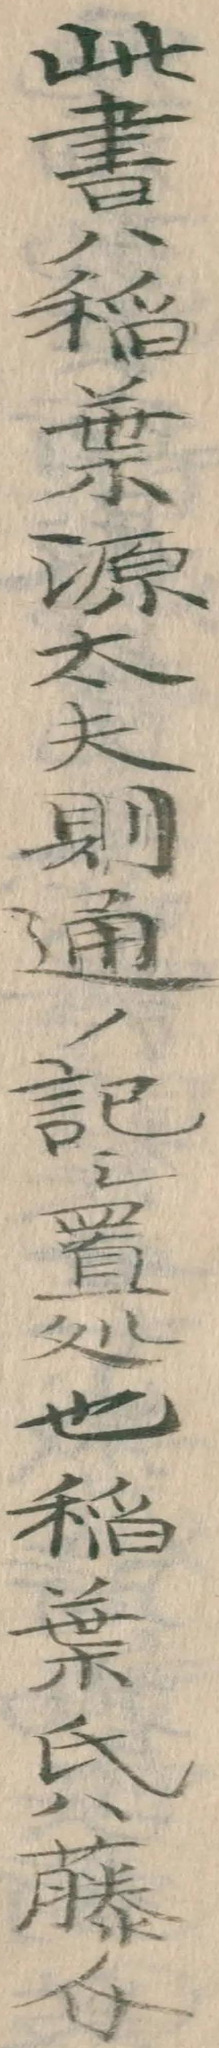此書ハ稲葉源太夫則通ノ記シ置処也稲葉氏ハ藤介
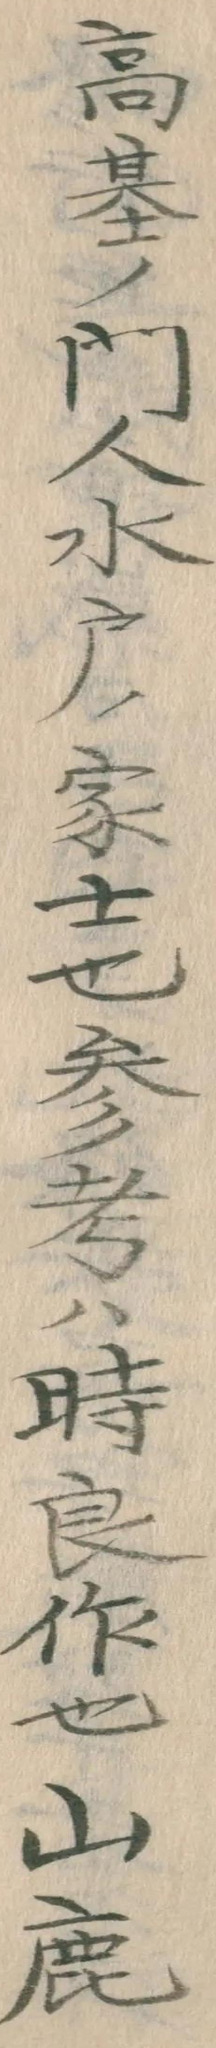高基ノ門人水戸ノ家士也参考ハ時良作也山鹿
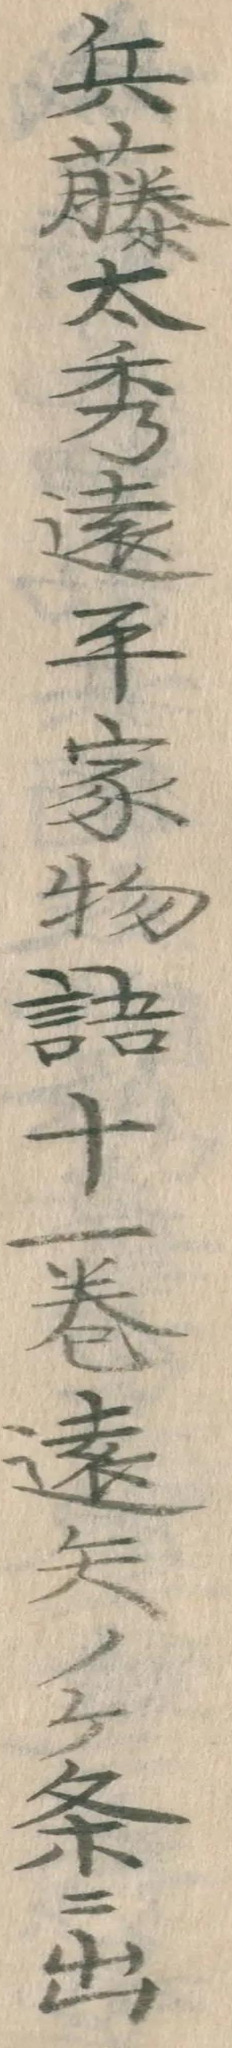兵藤太秀遠平家物語十一巻遠矢ノ箇条ニ出
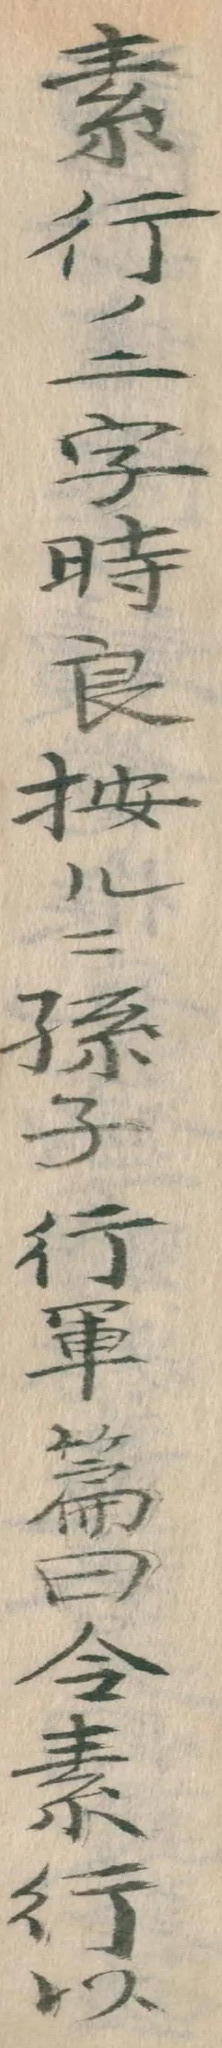素行ノ二字時良按ルニ孫子行軍篇曰今素行以
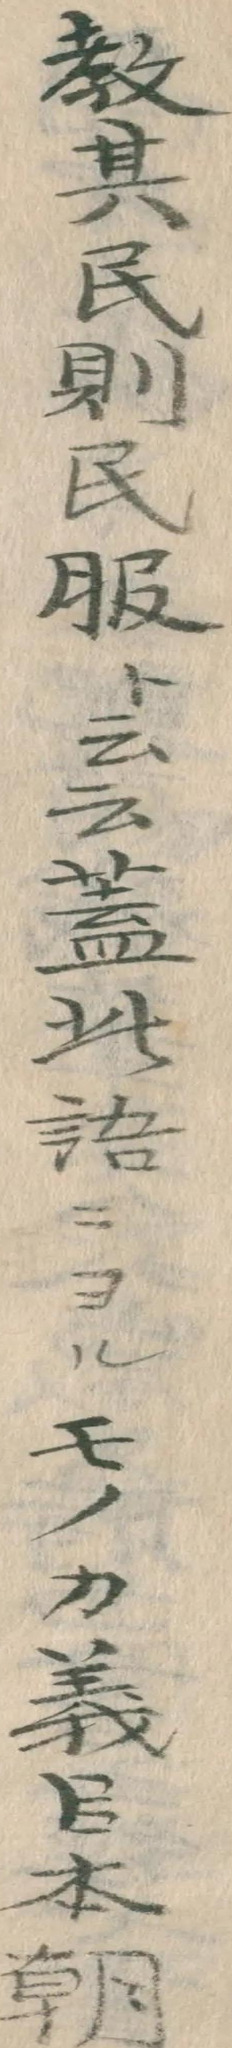教其民則民服ト云云蓋此語ニヨルモノカ義本朝
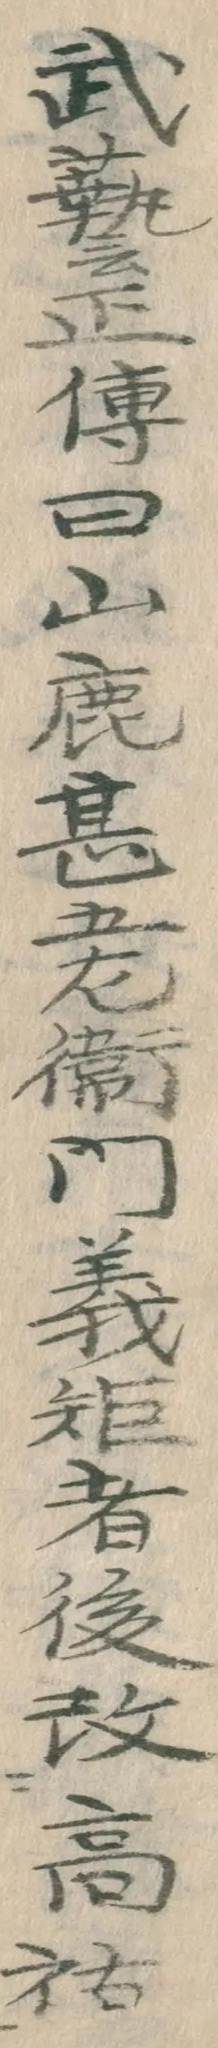武芸正伝曰山鹿甚五左衞門義矩者後改高祐
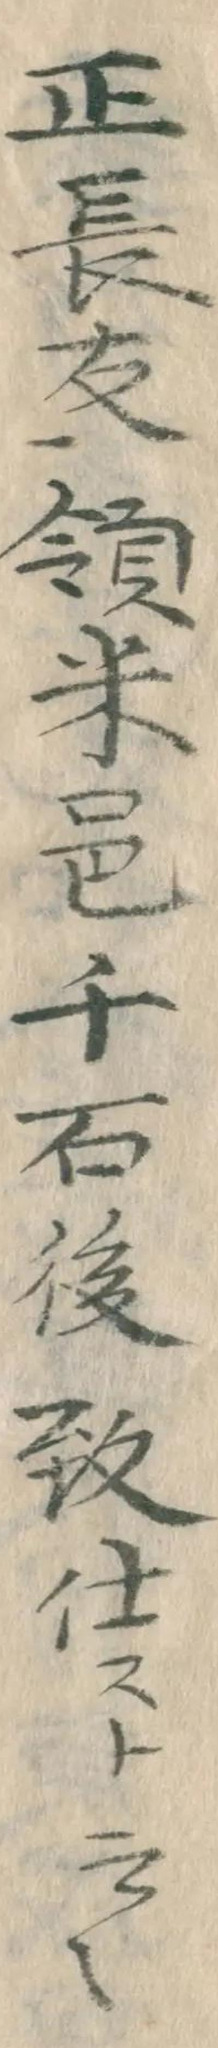正長友領米邑千石後致仕スト云

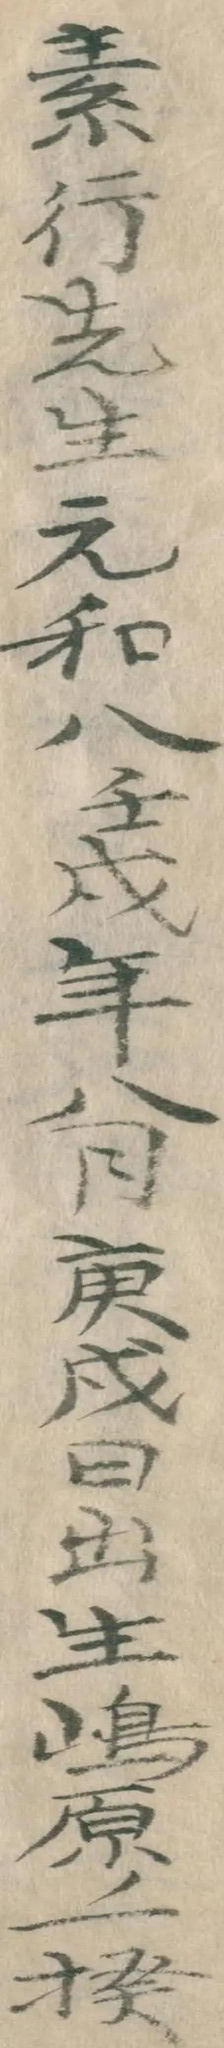素行先生元和八壬戌年八月庚戌日出生嶋原ノ一揆
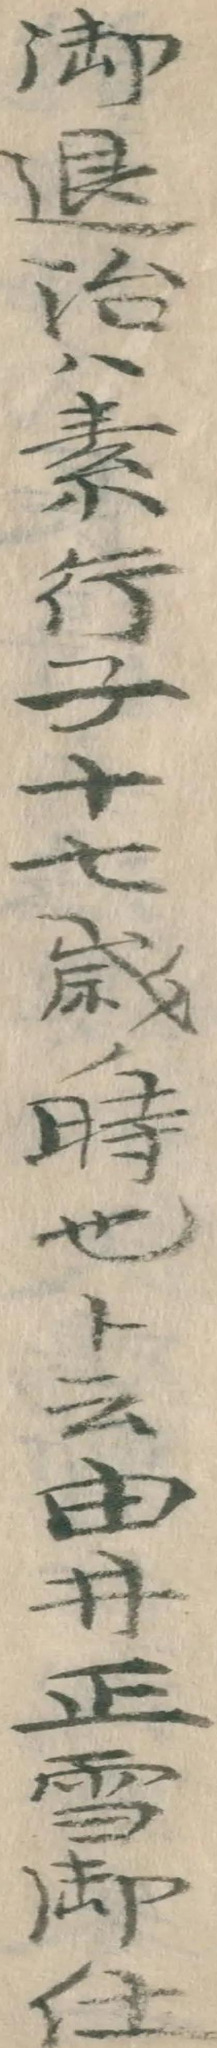御退治ハ素行子十七歳ノ時也ト云由井正雪御仕
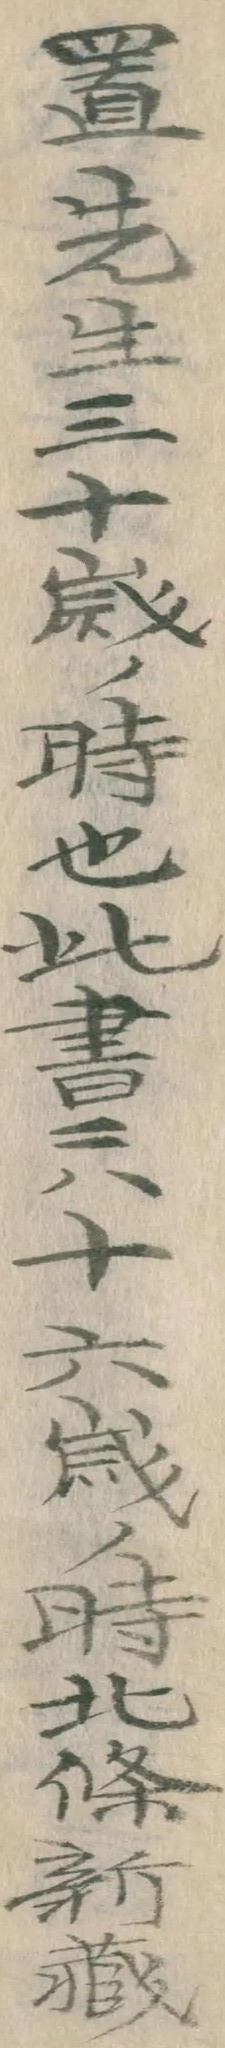置先生三十歳ノ時也此書ニハ十六歳ノ時北条新蔵
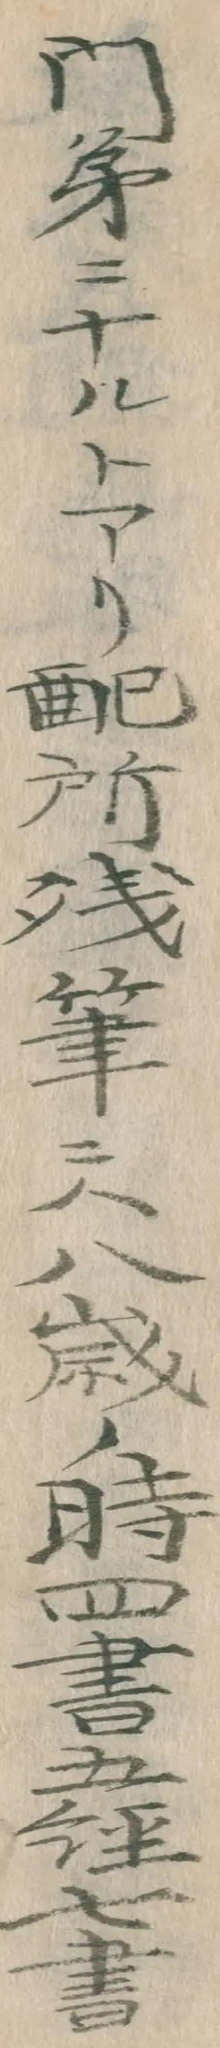門弟ニナルトアリ配所残筆ニハ八歳ノ時四書五経七書
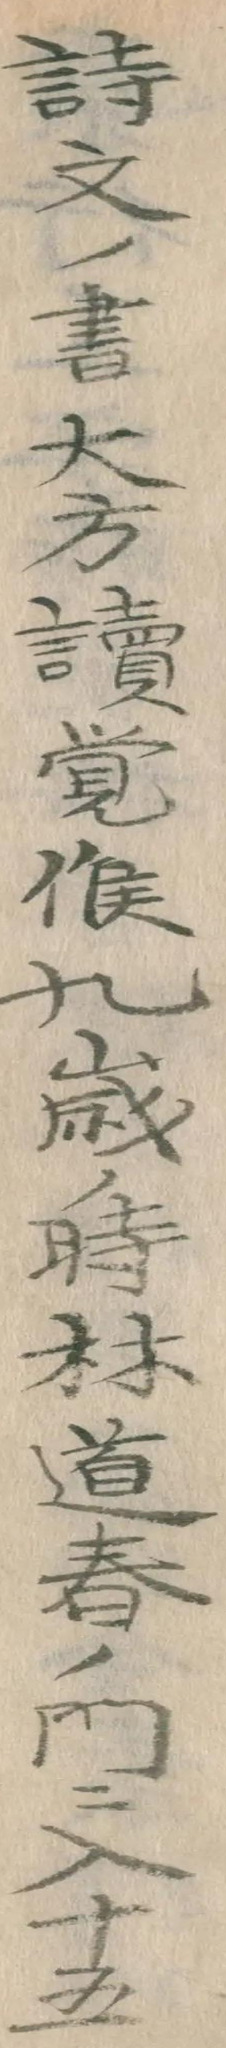詩文ノ書大方読覚候九歳ノ時林道春ノ門ニ入十五
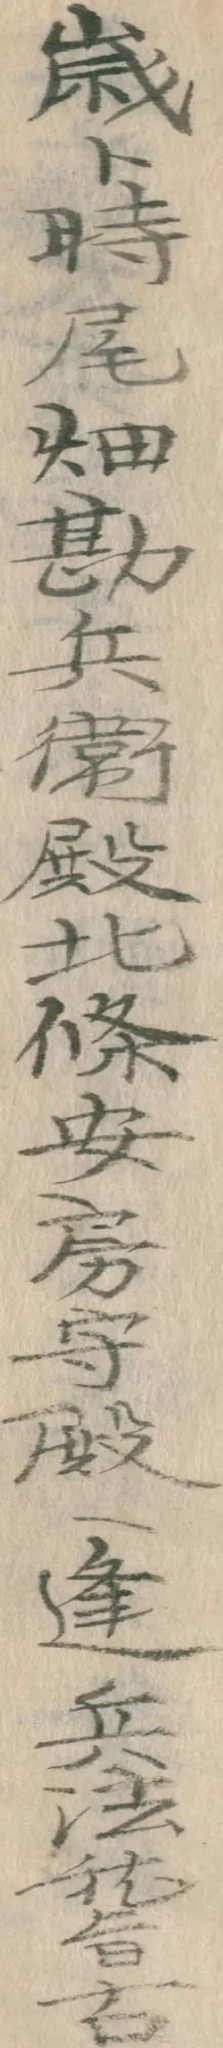歳ト時尾畑勘兵衞殿北条安房守殿ヘ逢兵法稽古
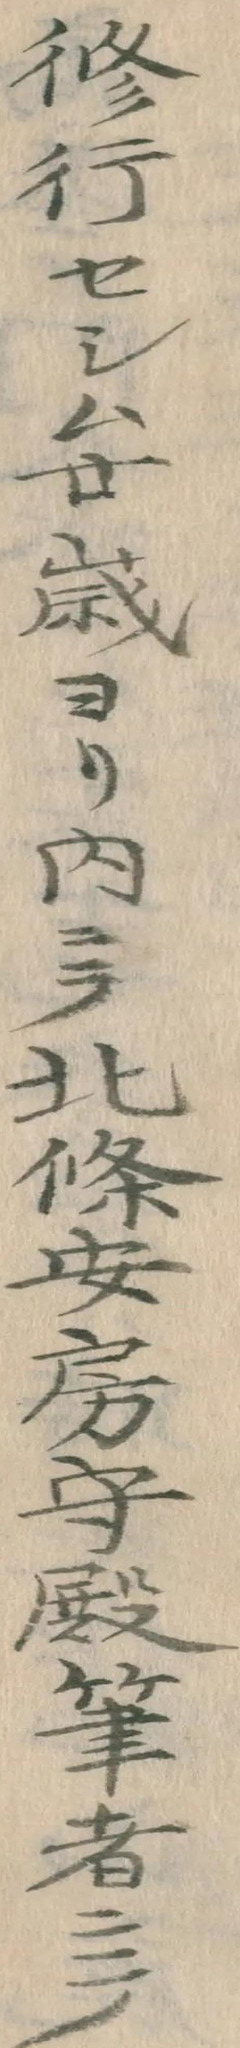行セシム廿歳ヨリ内ニテ北条安房守殿筆者ニテ
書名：輪池叢書. 12
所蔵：国立国会図書館 National Diet Library, JAPAN
